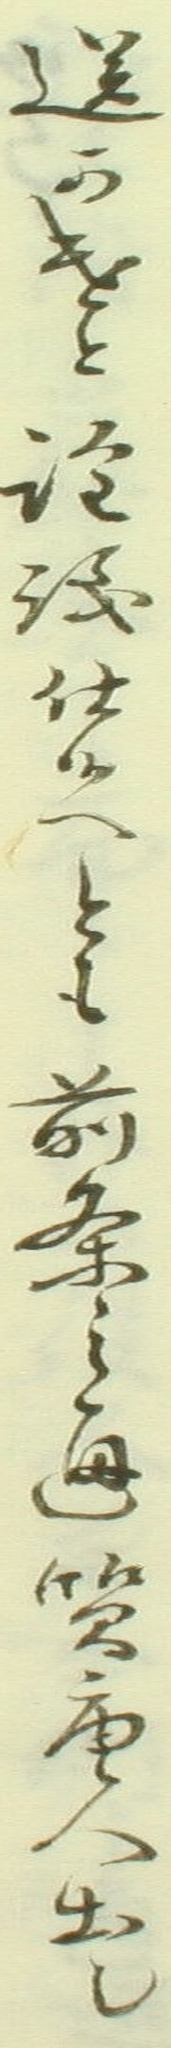送可遣と詮議仕候へとも前条之通質唐人出し
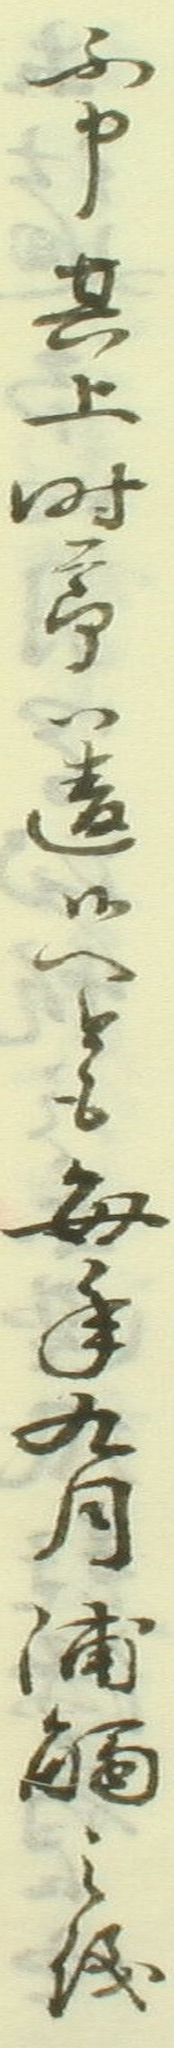不申其上時節は違候へとも毎年九月浦触之儀
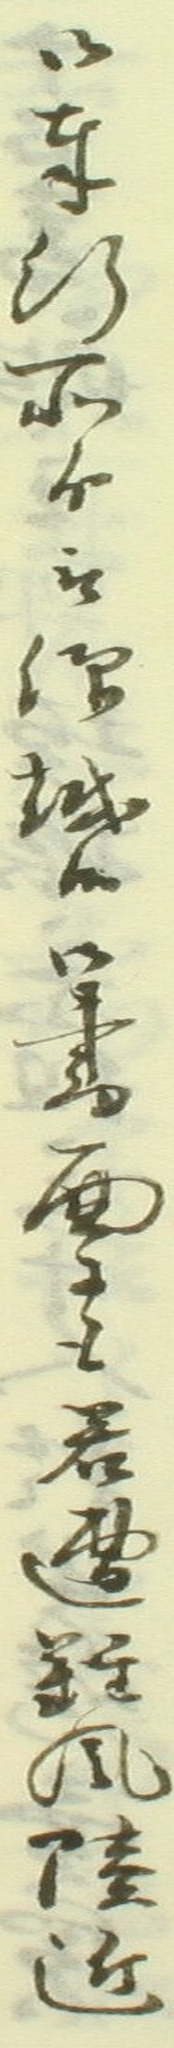御奉行所ゟ被仰越候御書面にも若遭南風陸近
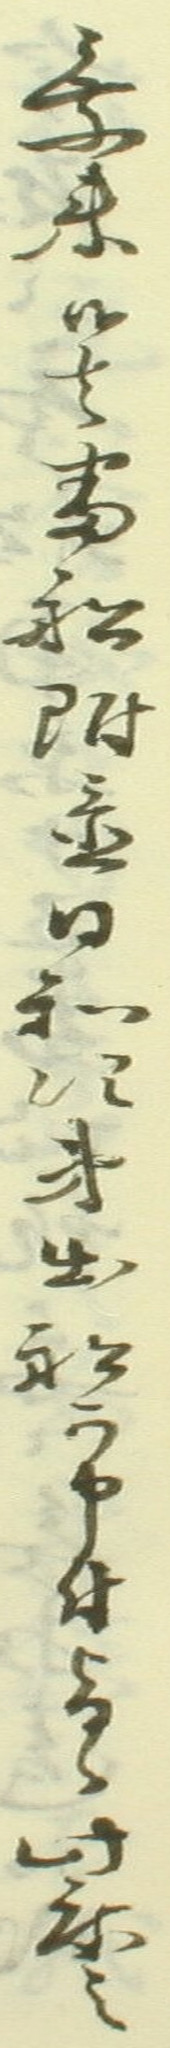乗来候は番船附置日和次第出船可申付旨候此度之
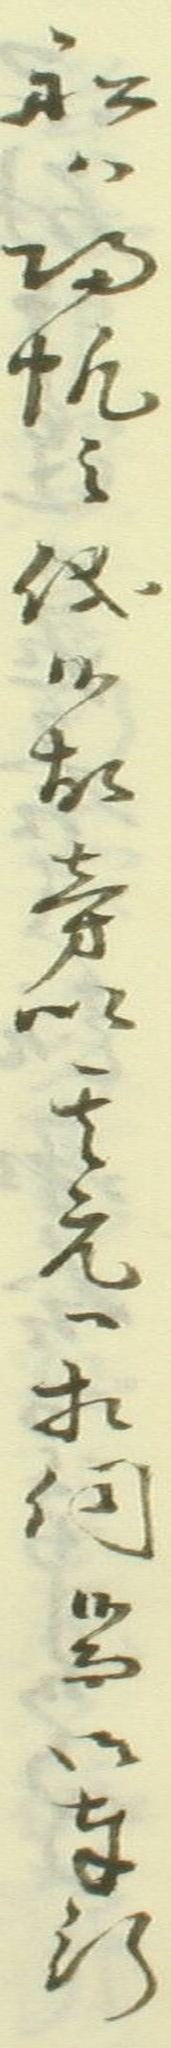船は帰帆之儀候故旁以其元へ相伺候而御奉行
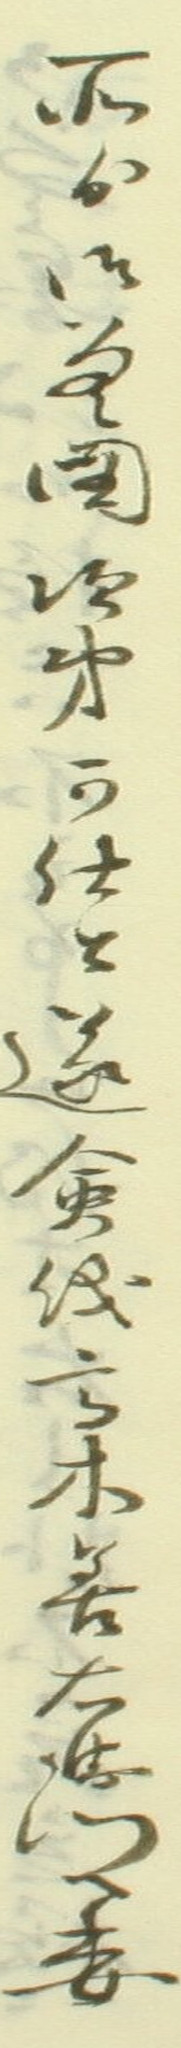初所ゟ御差図次第可仕と遂僉儀高木善右衛門へ委
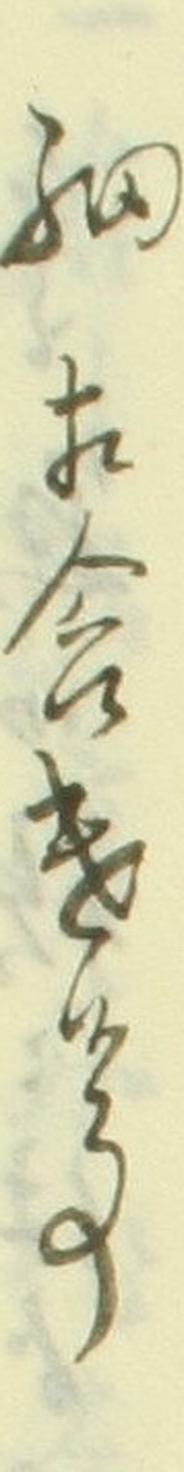細相含遣候事
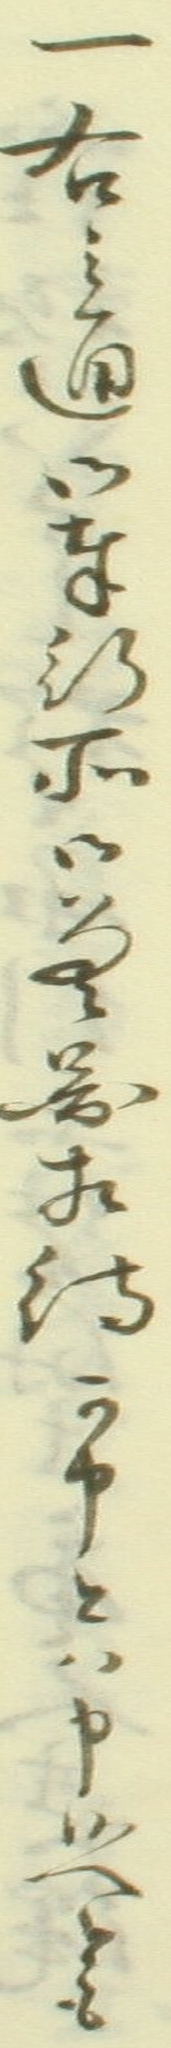一右之通御奉行所御差図相待可申とは申候へとも
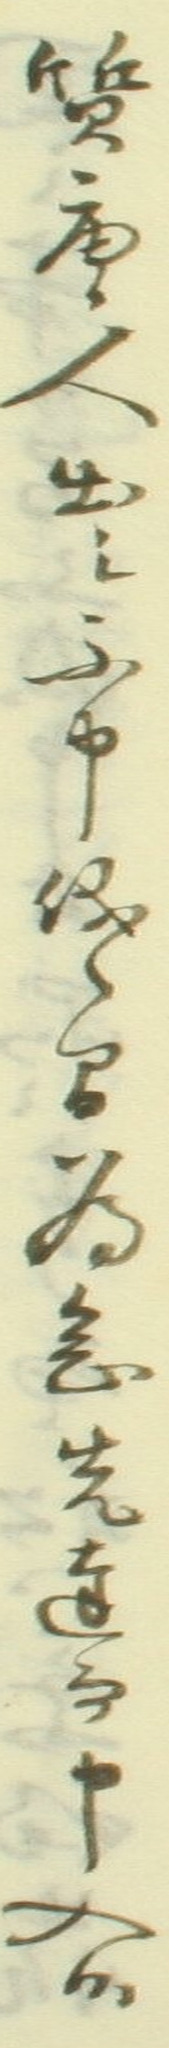質唐人出し不申儀候間為念先達而申入候
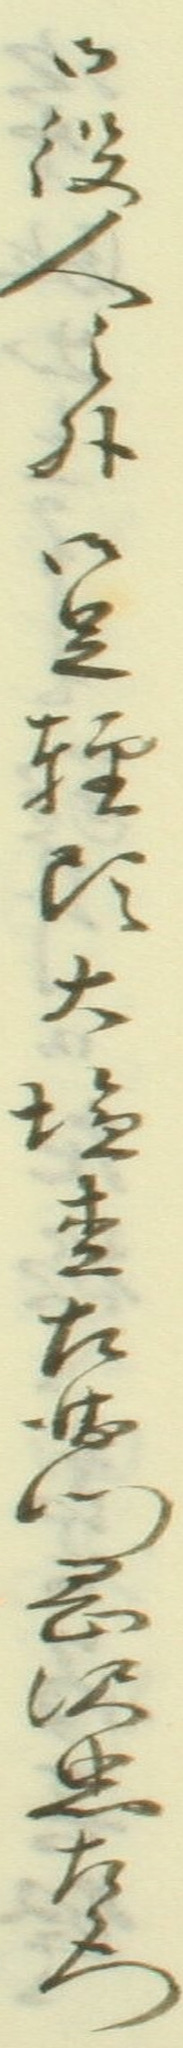御役人之外御足軽頭大塩杢左衛門岡沢忠左衛門
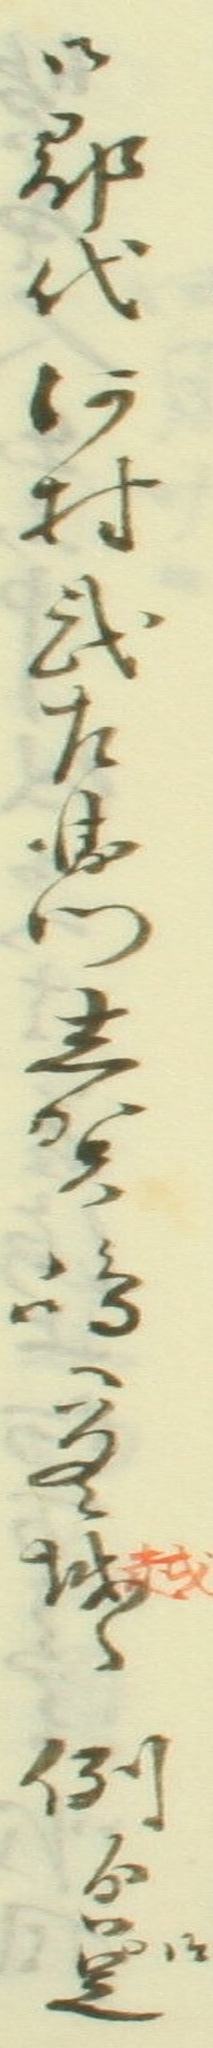御郡代河村武左衛門志賀島へ差越候例ゟ◦足
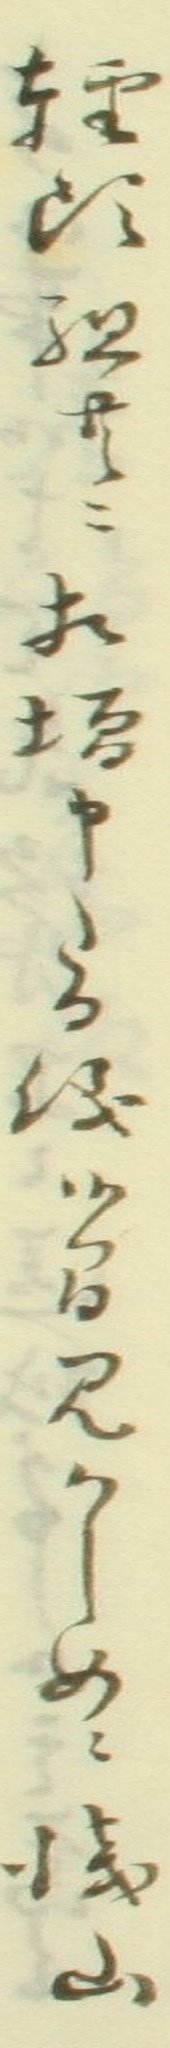軽頭組共に相増申たる儀候間見かしめに浅山
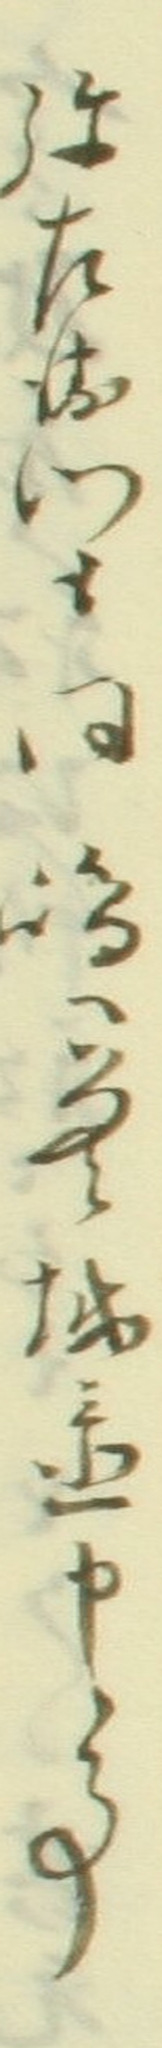弥左衛門も同島へ差越置申事

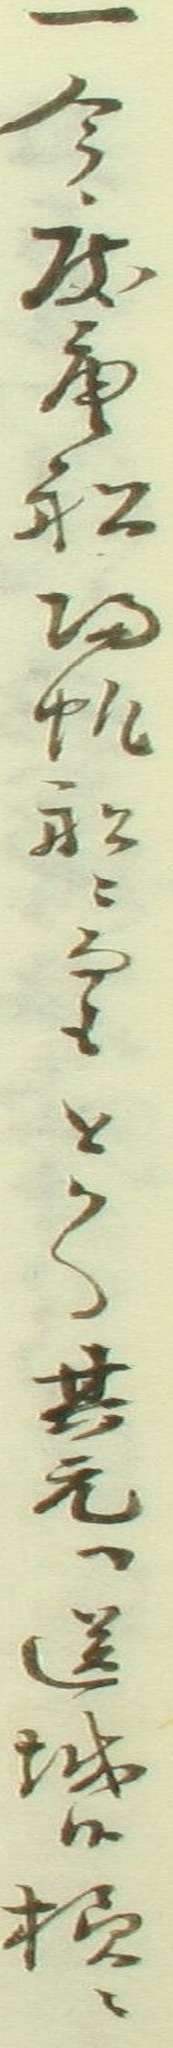一今度唐船帰帆船に而もとかく其元へ送越候様に
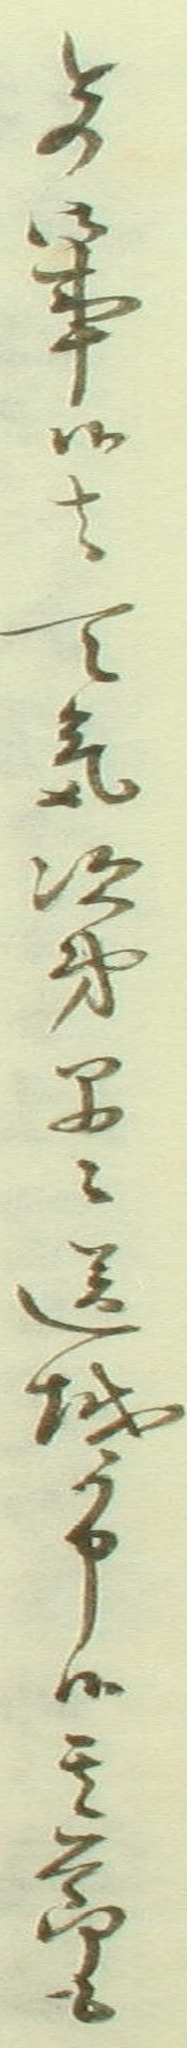との御事候は天気次第早々送越可申候其節も
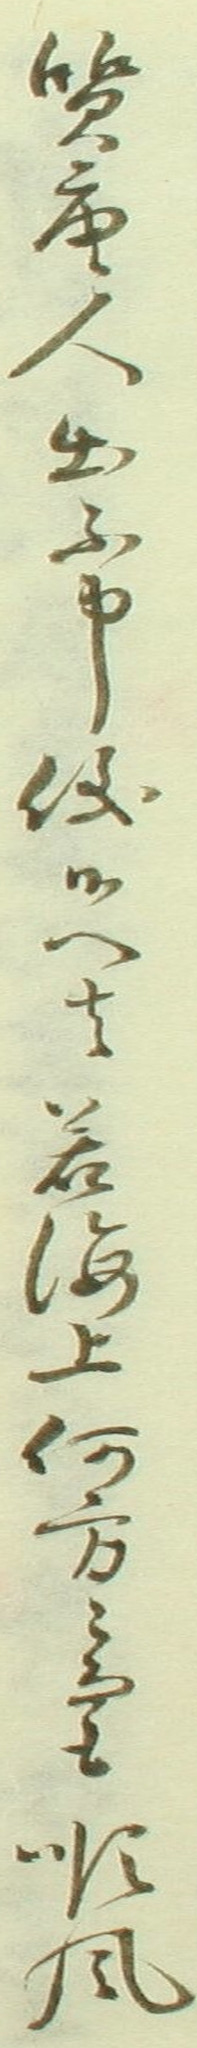質唐人出不申儀候へは若海上何方に而も順風
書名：異国船漂着記
